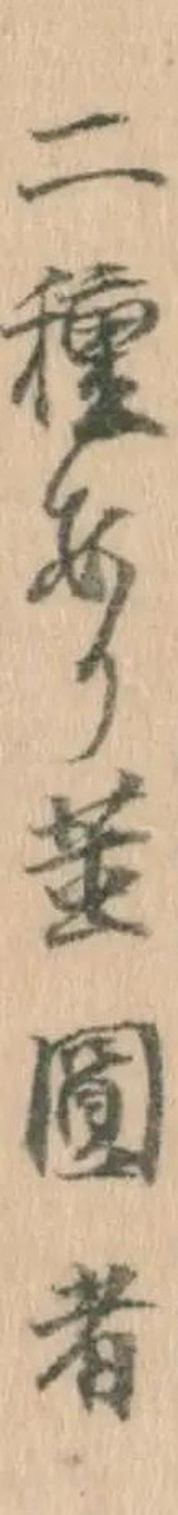二種あり茎円者
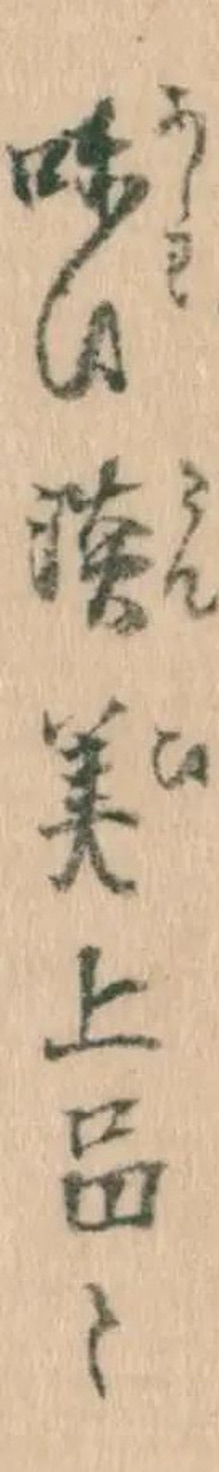味ひ淡美上品と
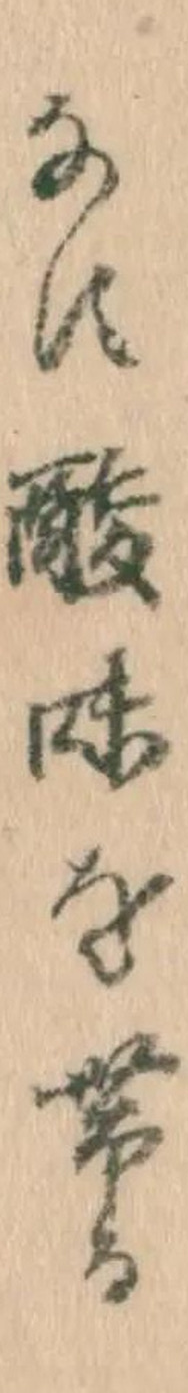なす酸味を帯る
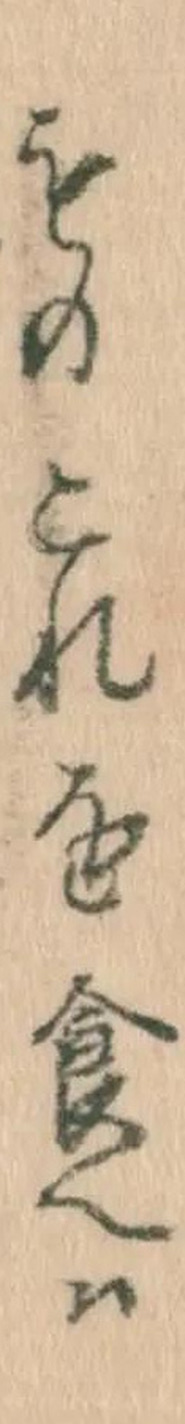ものこれを食へは
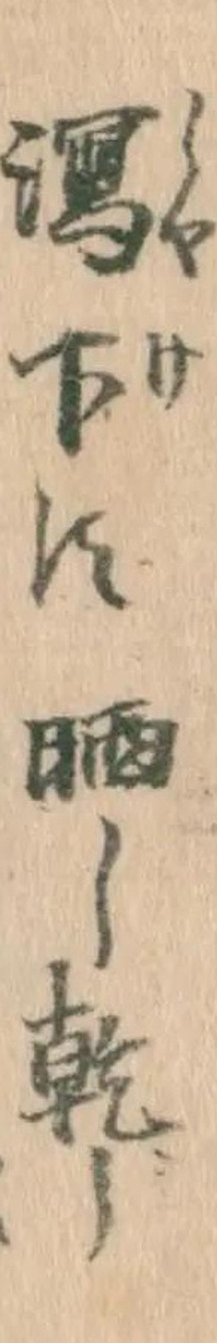瀉下す晒し乾し
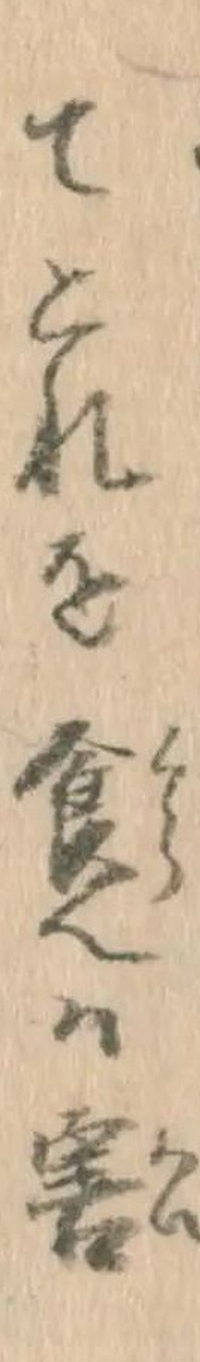てこれを食へは害
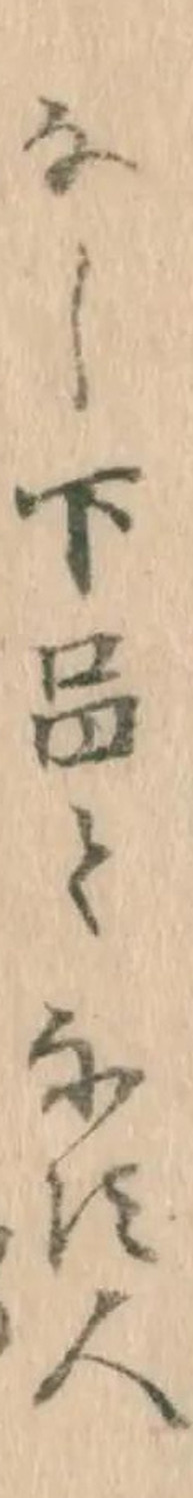なし下品となす人
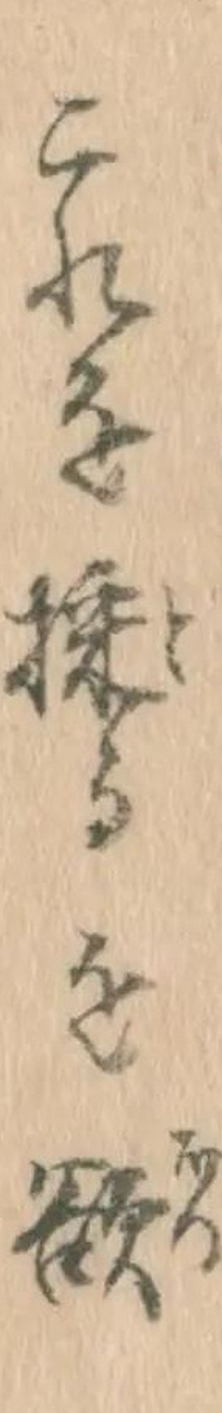これを採るを欲
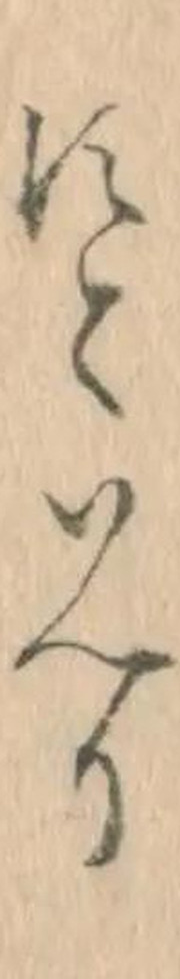すといへり

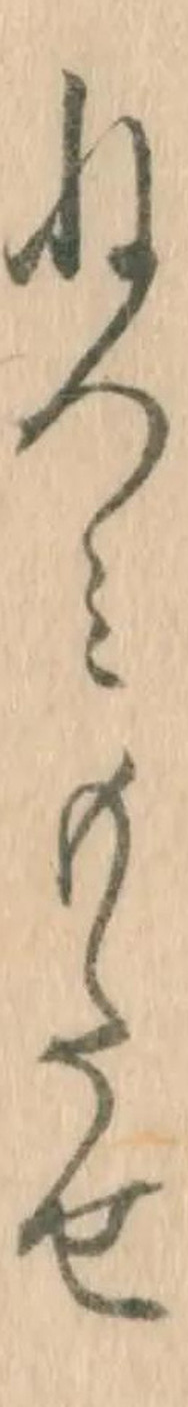ねつみもたせ
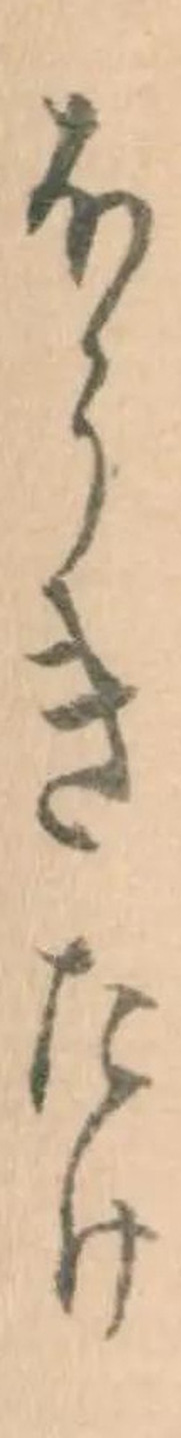ほうきたけ
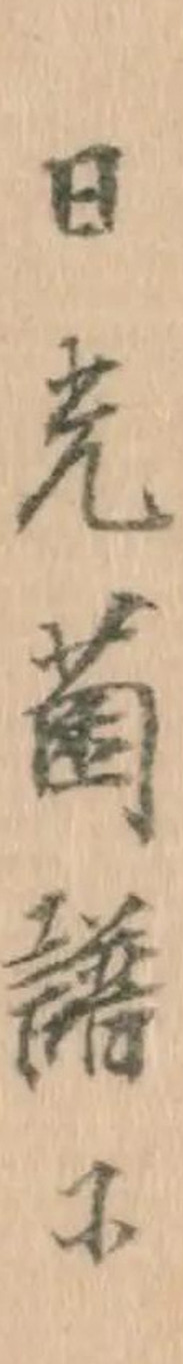日光菌譜に
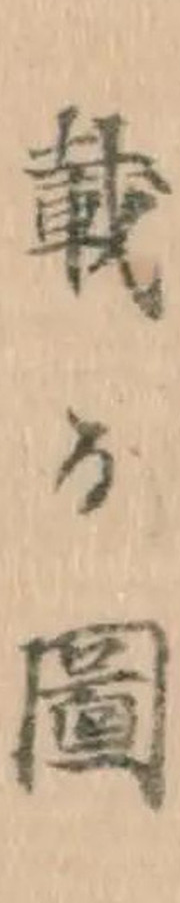載る図

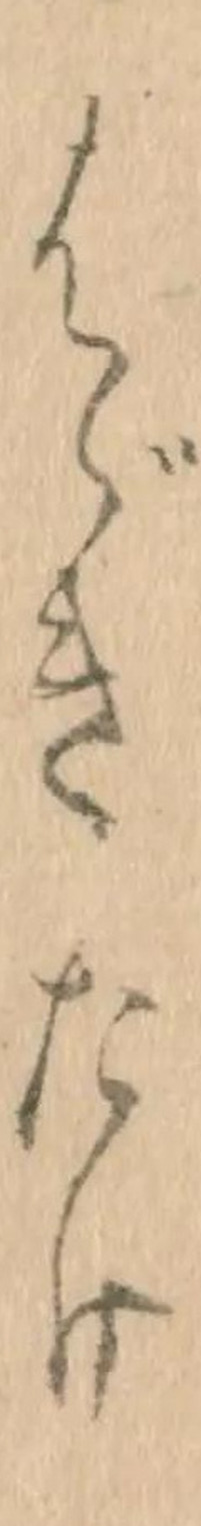はゞきたけ
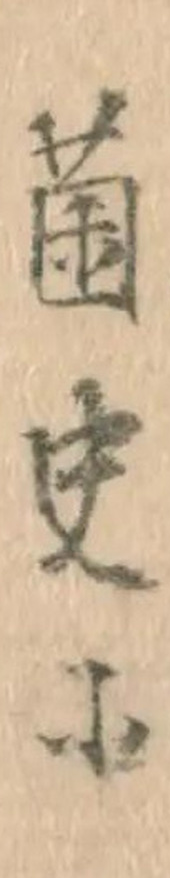菌史に
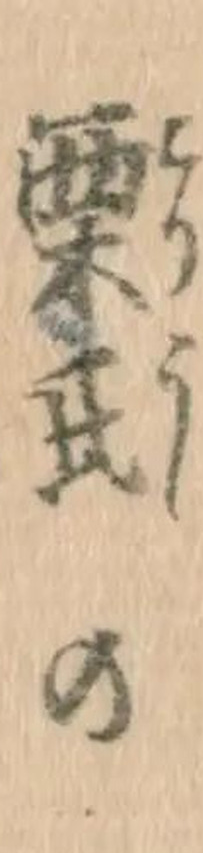栗氏の
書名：本草図譜. 巻58-60
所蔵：国立国会図書館 National Diet Library, JAPAN
